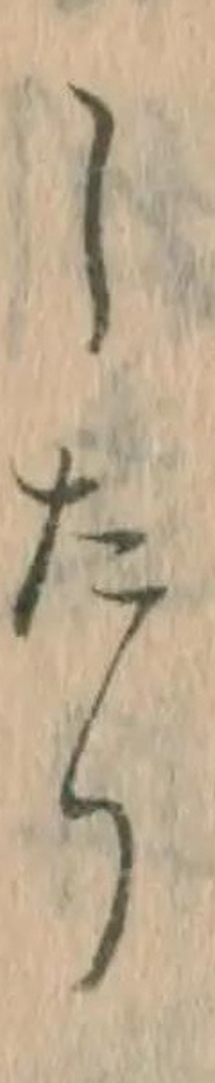したり
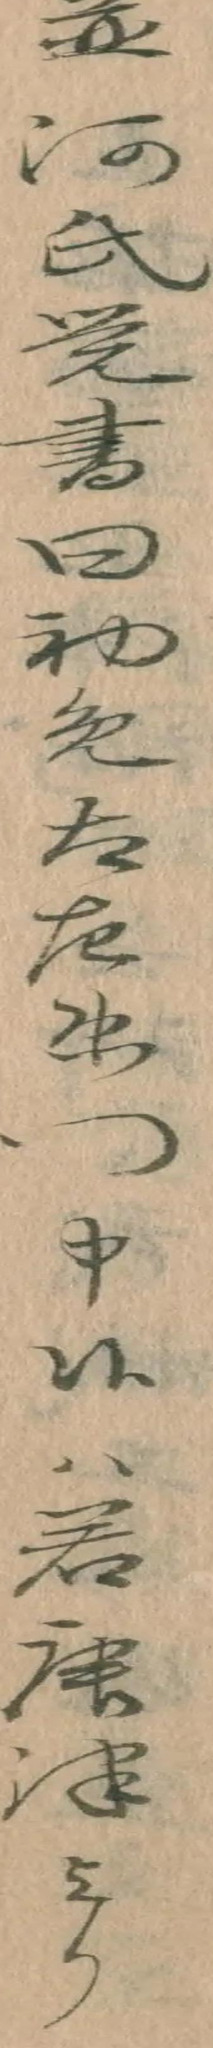並河氏覚書曰初め太左衛門申候は若唐津より
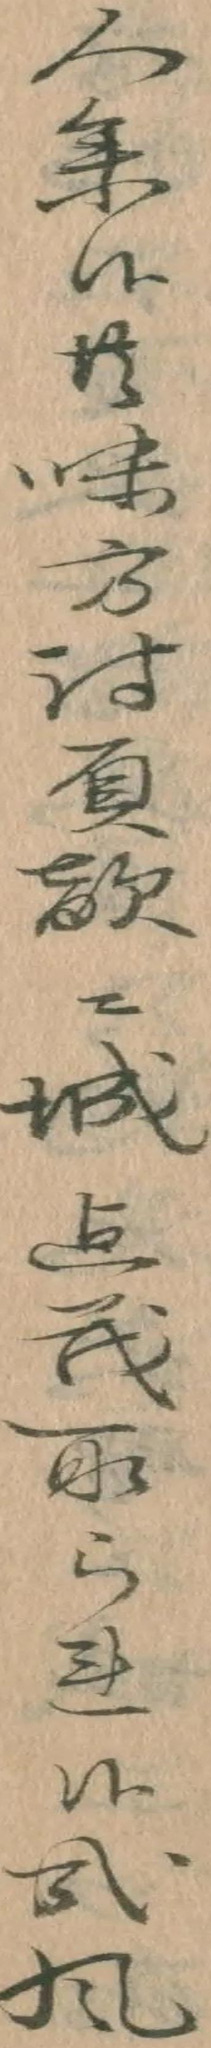人参候共味方打負敵に城迄も取られ候哉風
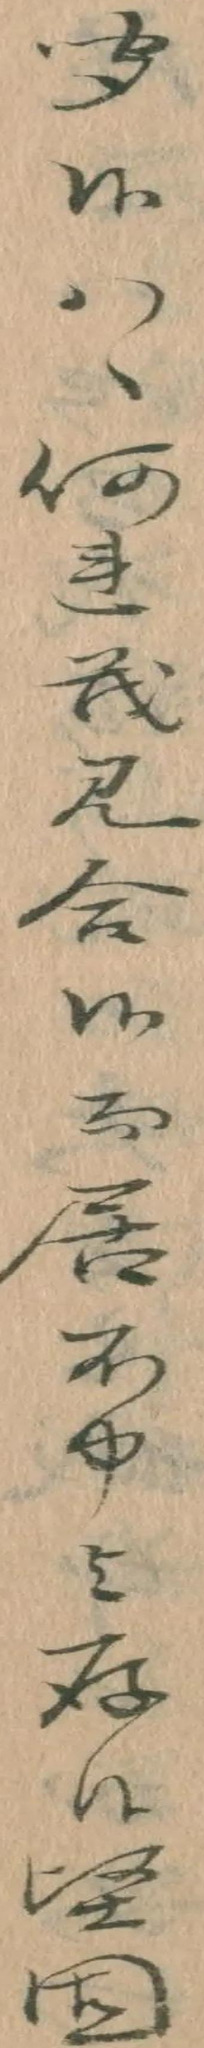聞候はゝ何れも見合候而居不申と存候堅固
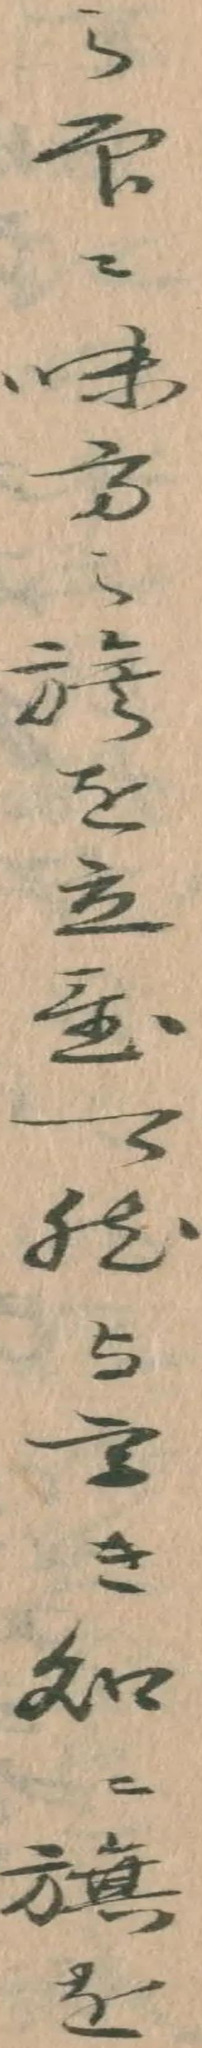之印に味方之旗を立置可然と高き処に旗を
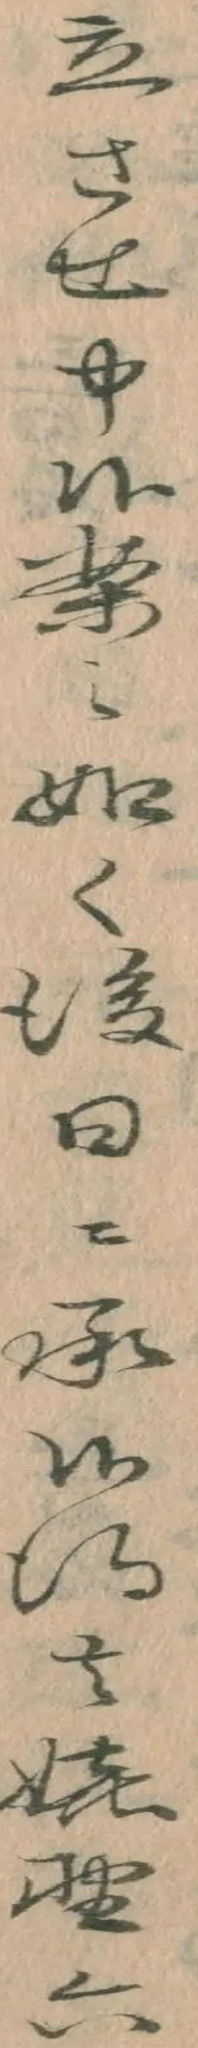立させ申候案之如く後日に承候得は嬉野六
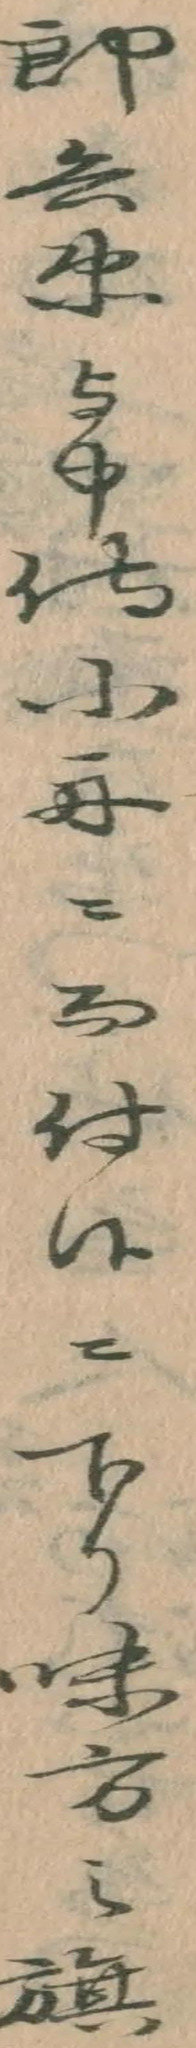郎兵衛と申侍小舟に而付候に下り味方之旗
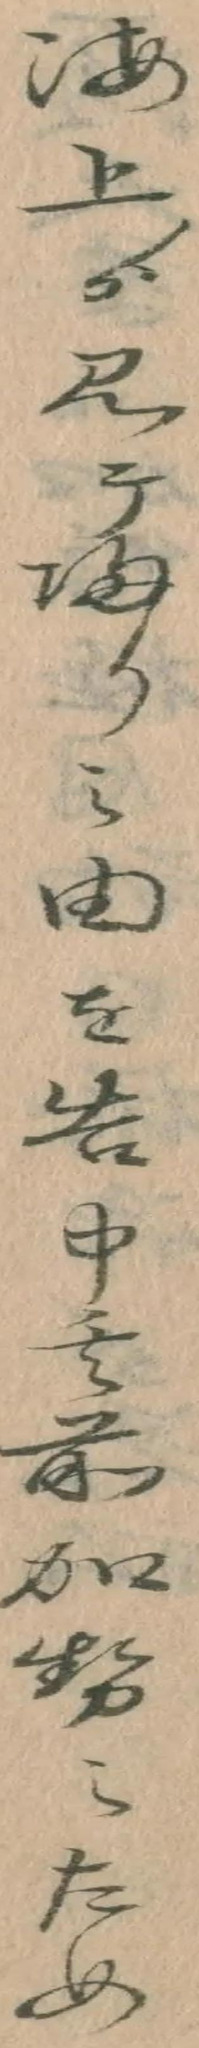海上ゟ見て帰り之由を告申其前加勢之ため
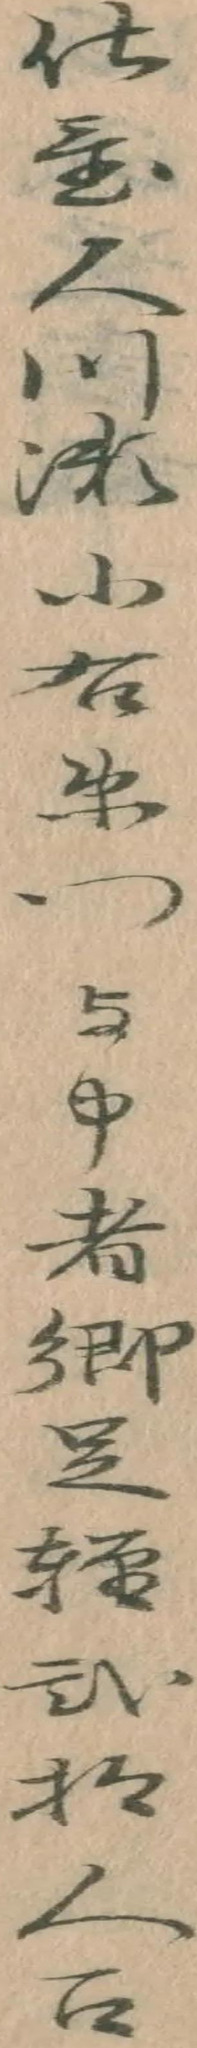仕置人川瀬小右衛門と申者郷足軽弐拾人召
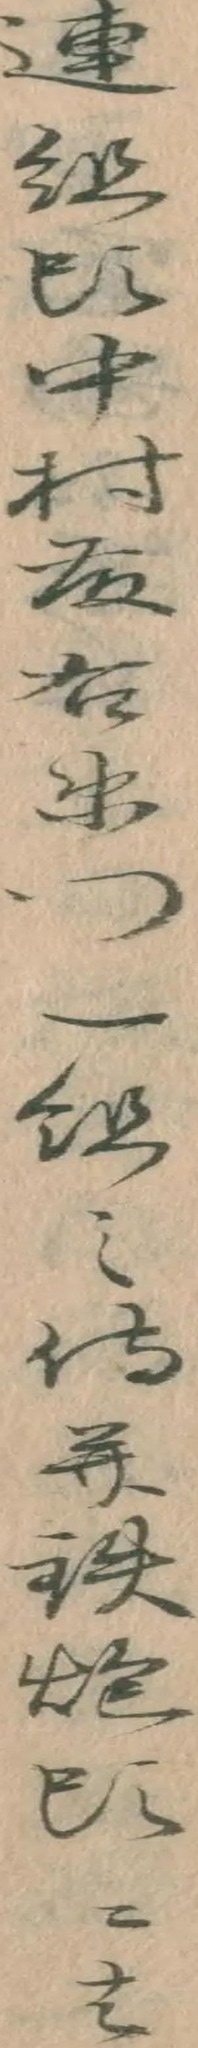連組頭中村藤右衛門一組之侍并鉄炮頭には
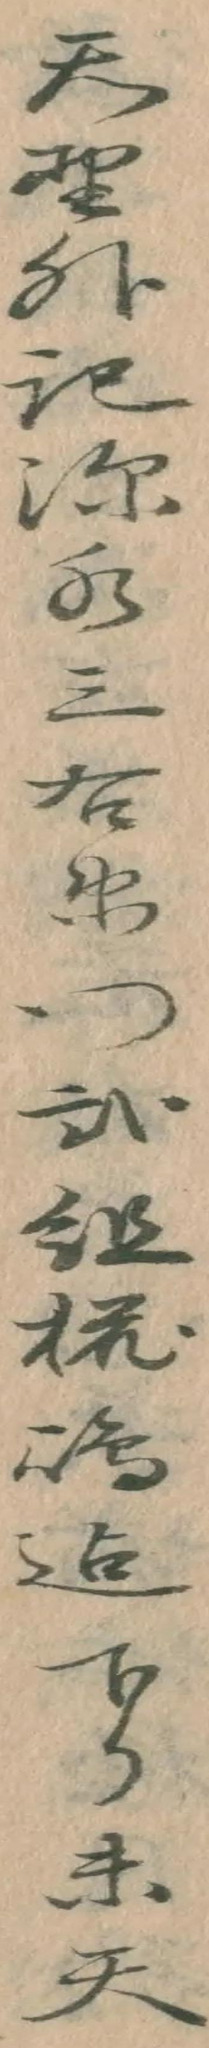天野外記深水三右衛門弐組椛島迄下り未天
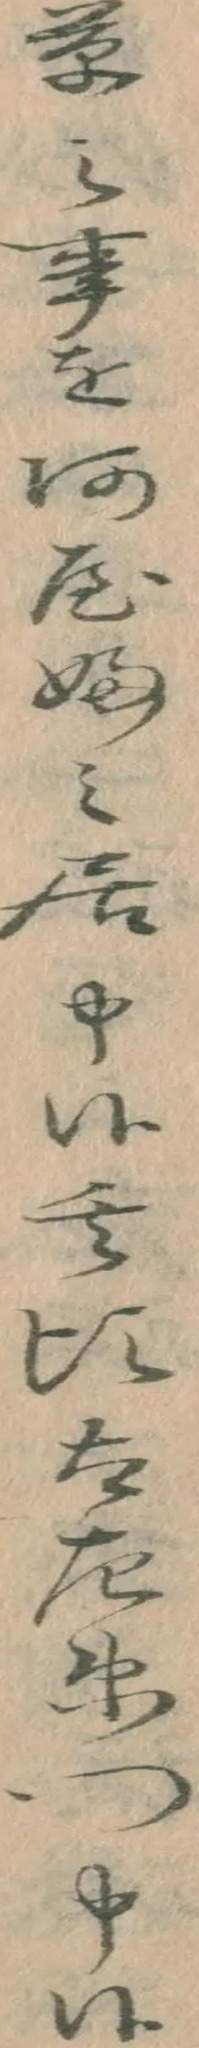草之事をあやふみ居申候其頃太左衛門申候
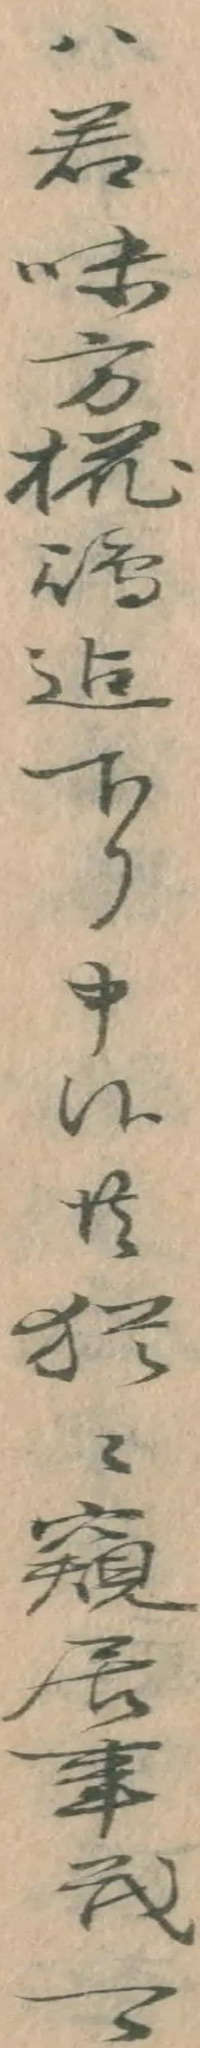は若味方椛島迄下り申候共猶々窺居事も可
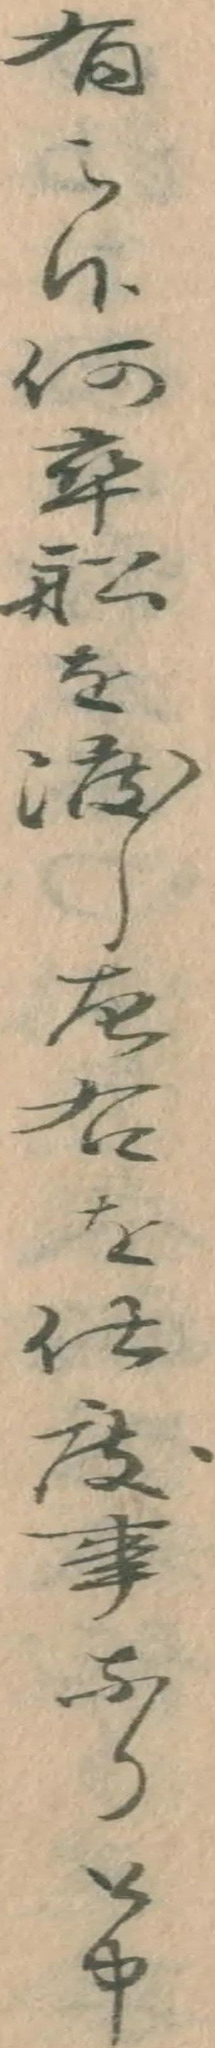有之候何卒船を渡し左右を仕度事なりと申

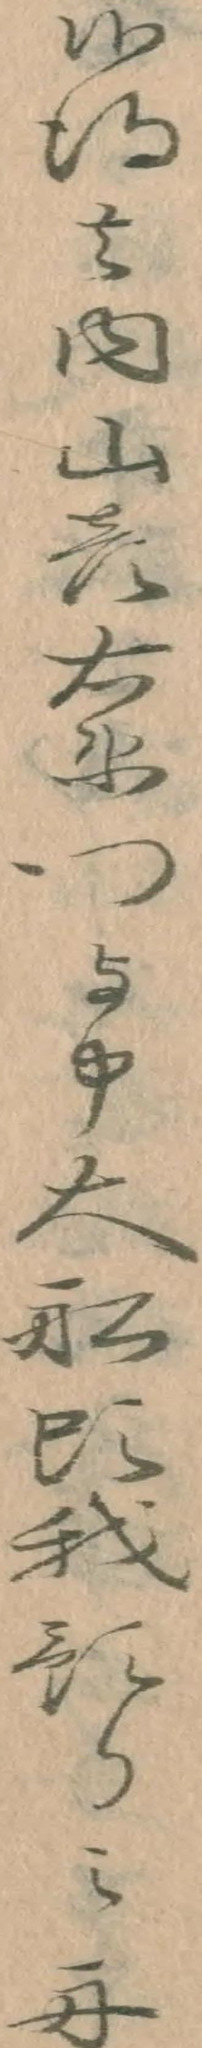候得は内山彦右衛門と申大船頭我預り之舟
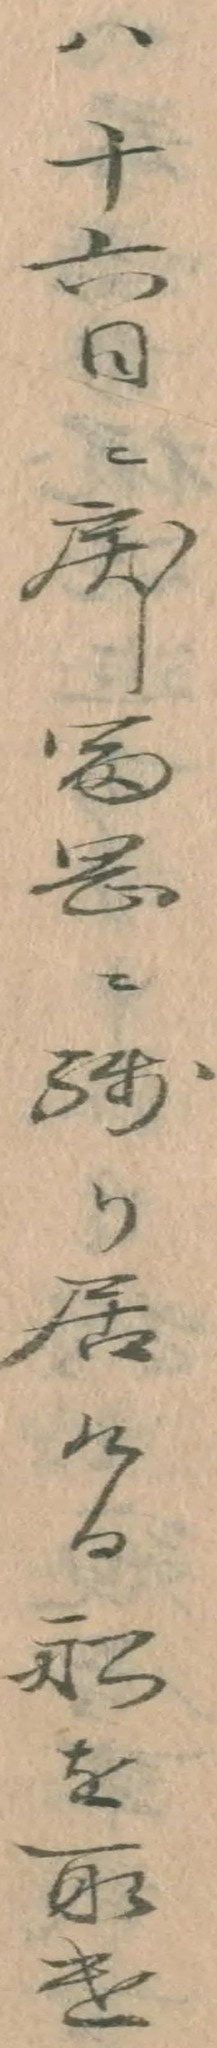は十六日に戻し富岡に残り居ける船を取遣
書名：切支丹御退治記 49巻. [3]
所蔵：国立国会図書館 National Diet Library, JAPAN
